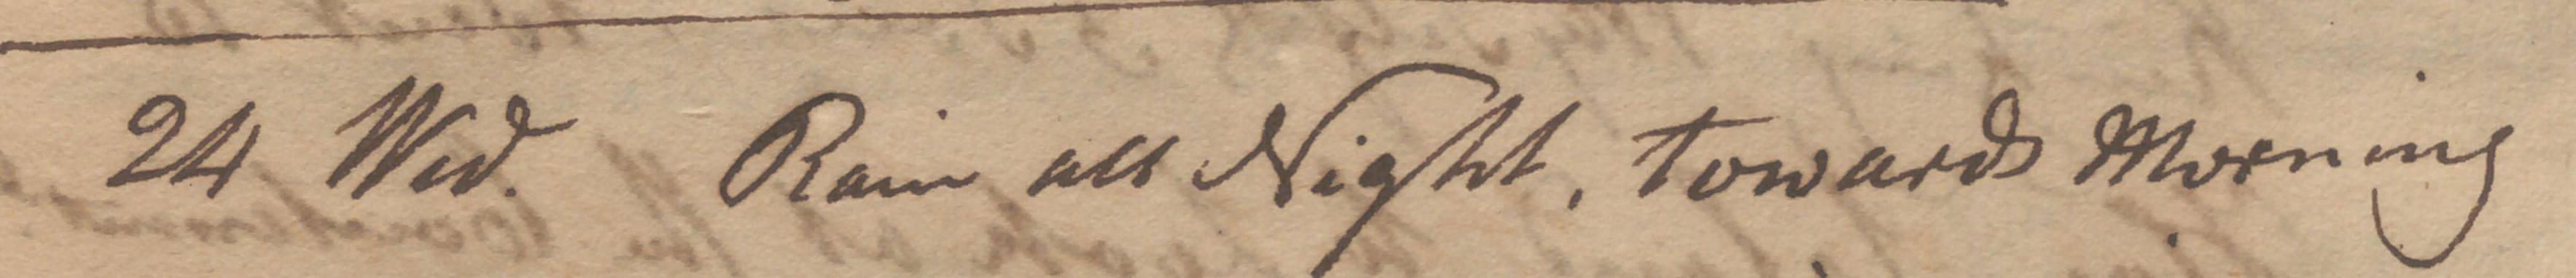24 Wed. Rain all Night, towards Morning
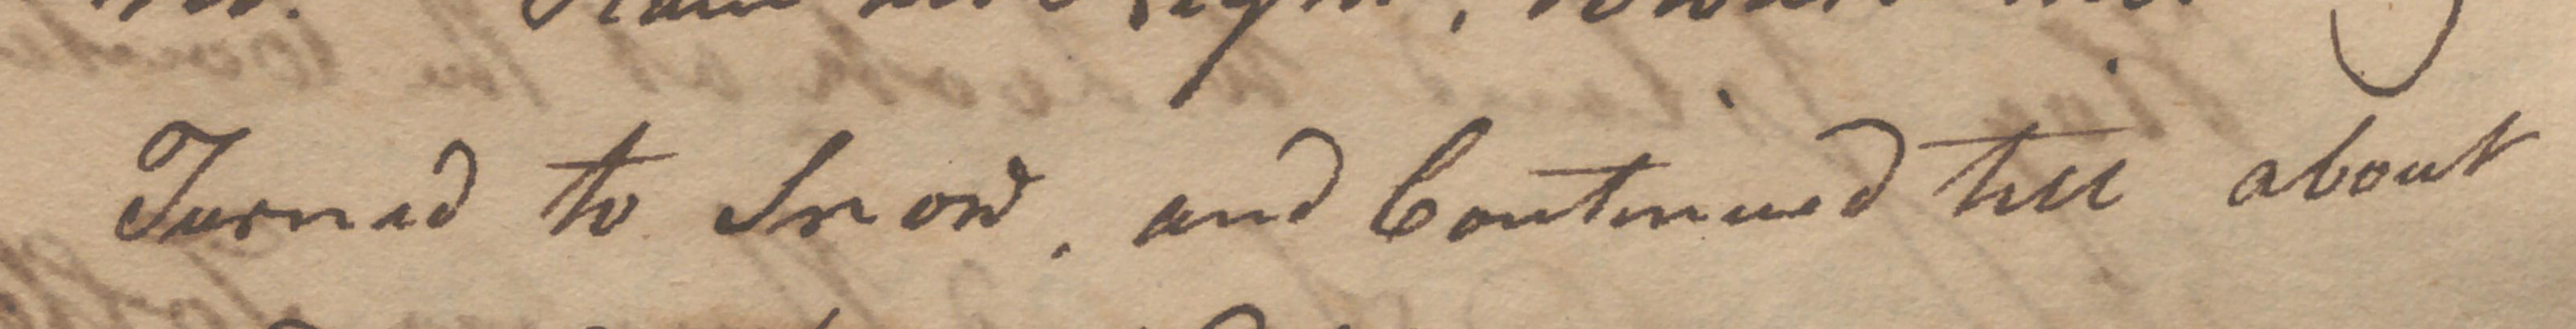Turned to Snow, and Continued till about
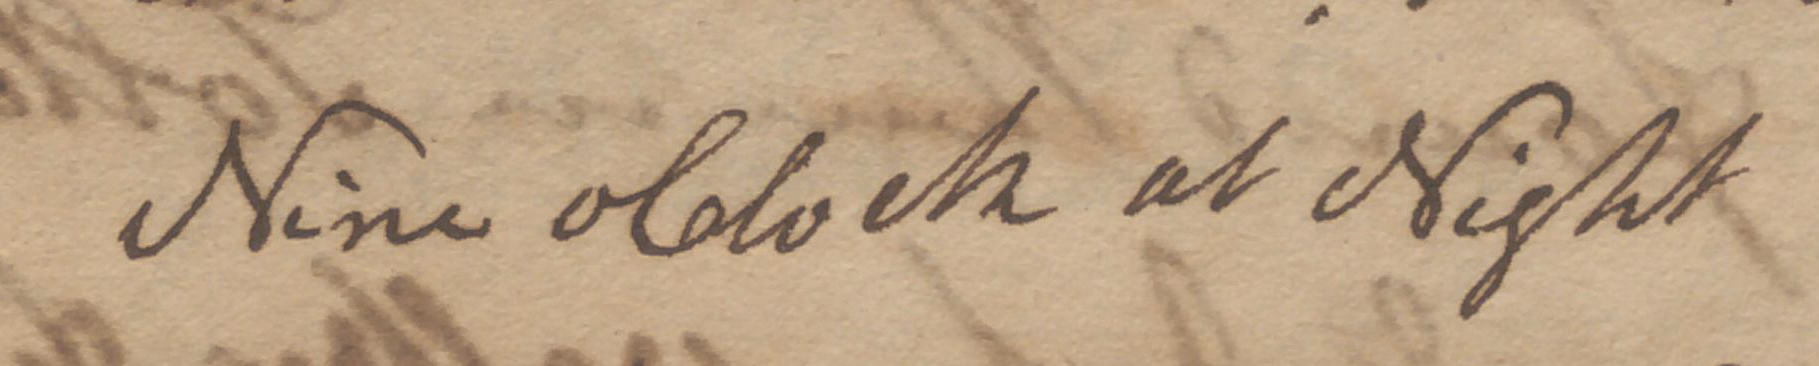Nine oClock at Night
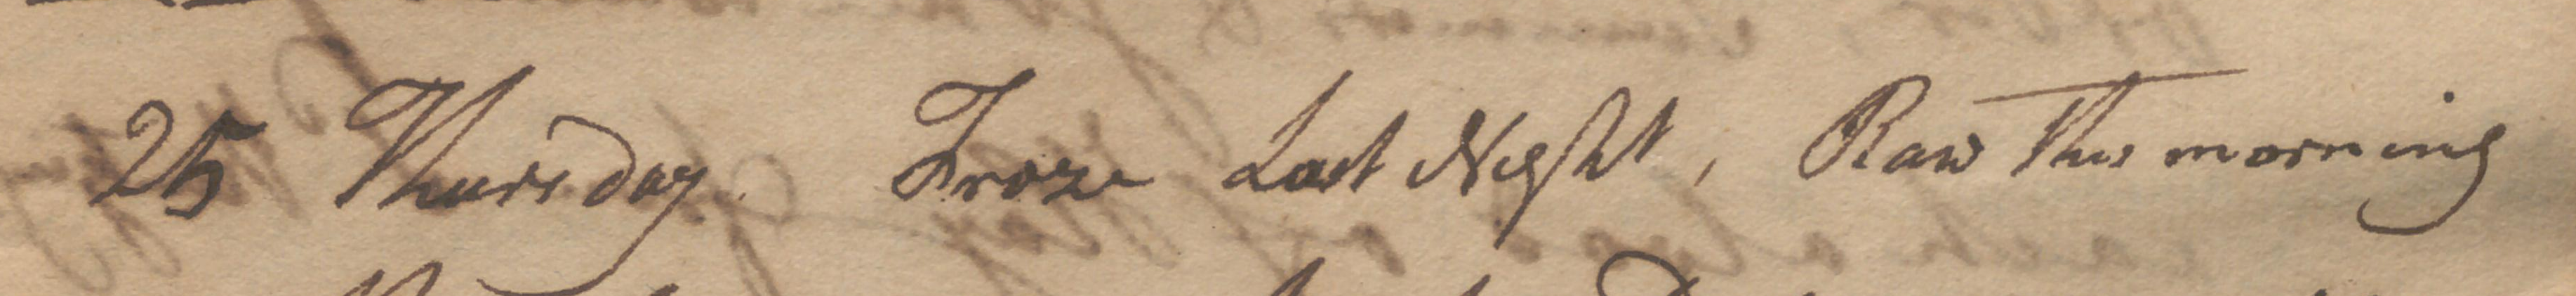25 Thursday Froze Last Night, Raw this morning
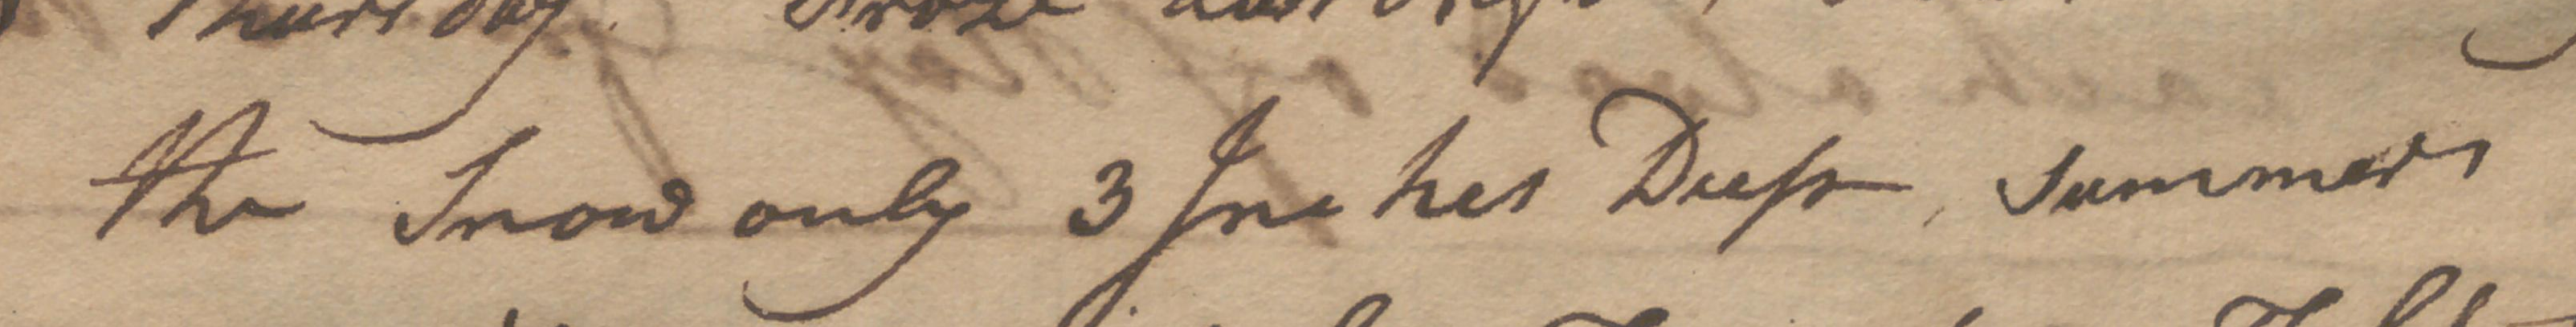the Snow only 3 Inches Deep, summers
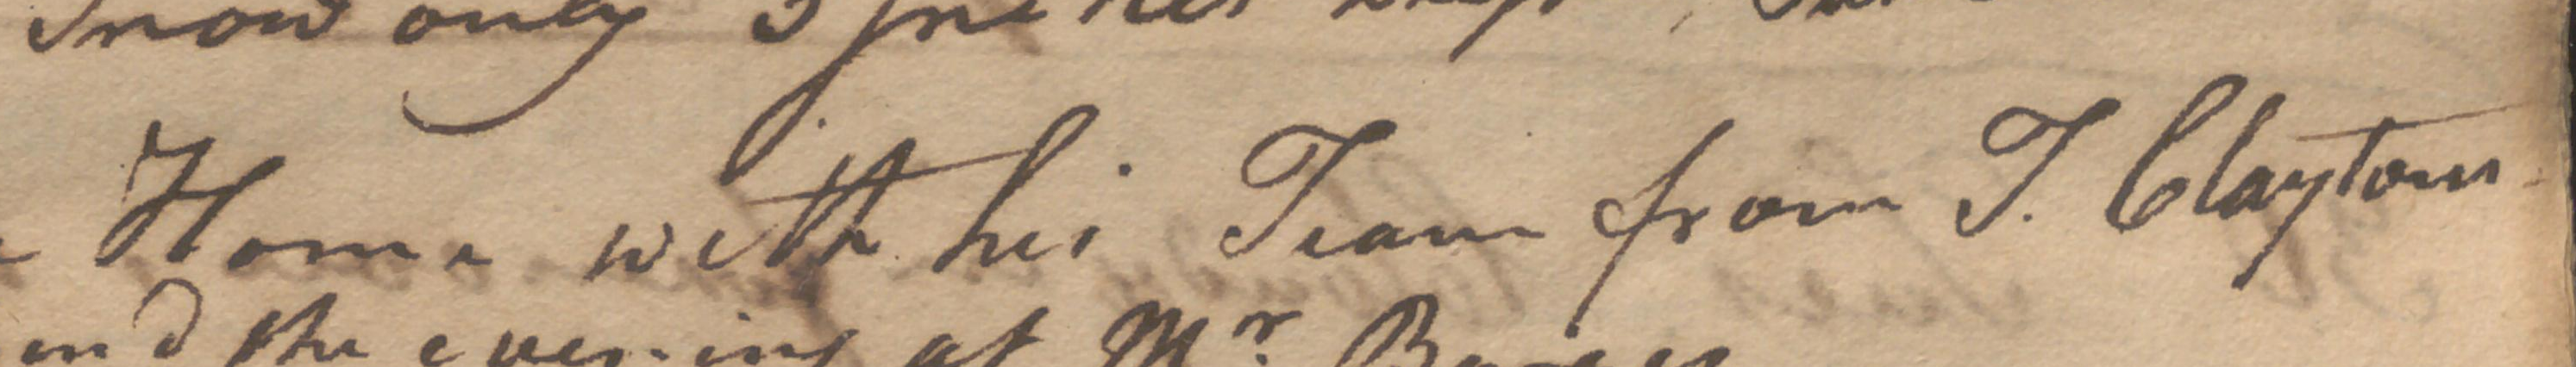Home with his Team from T. Claytons
